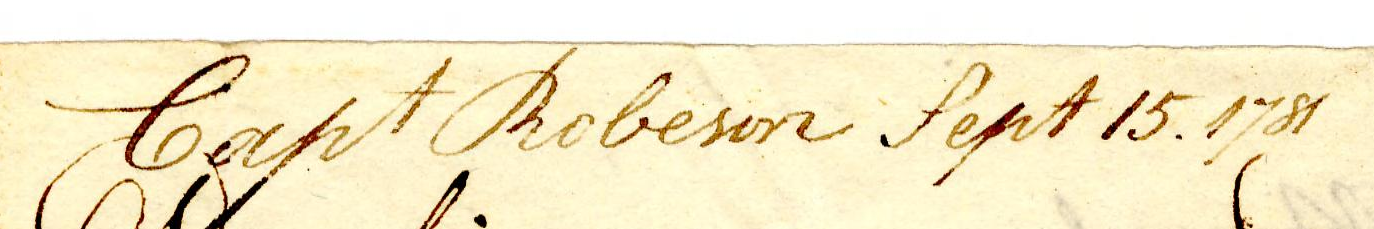Cap^t Robeson Sept 15. 1781
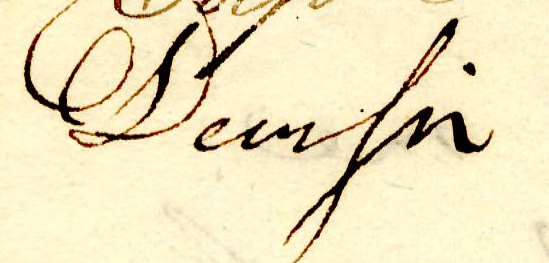Dear Sir
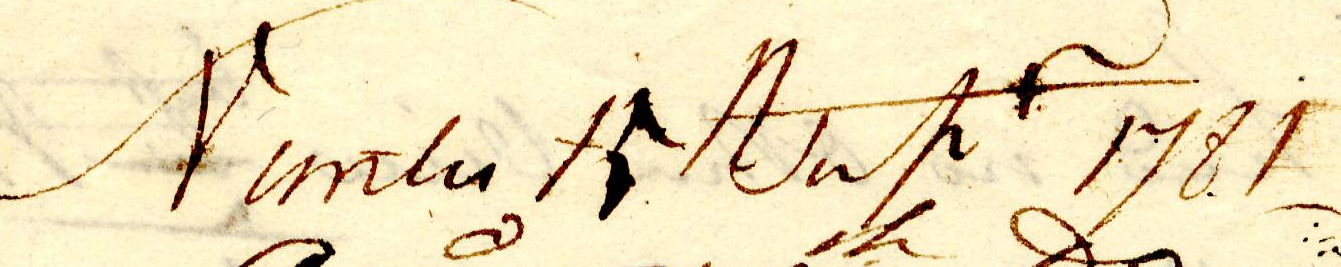Nantes 15^th Sep^r 1781
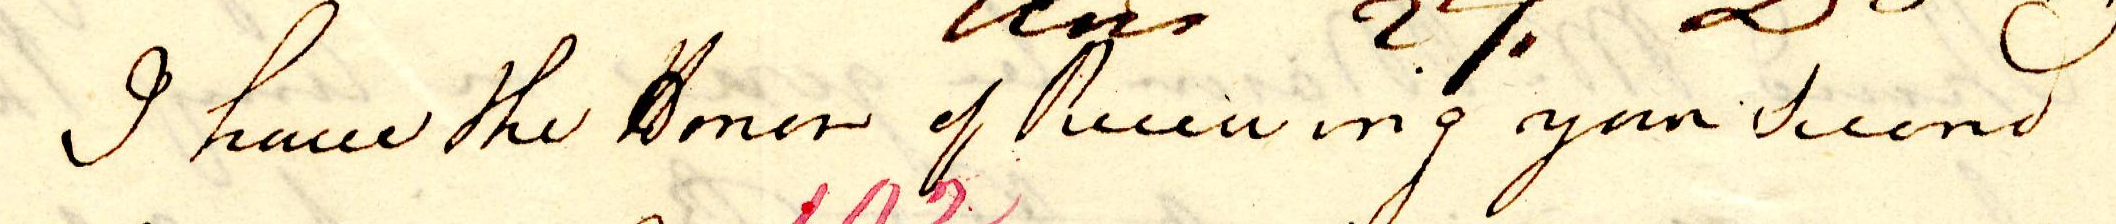I have the Honor of Receiving your second
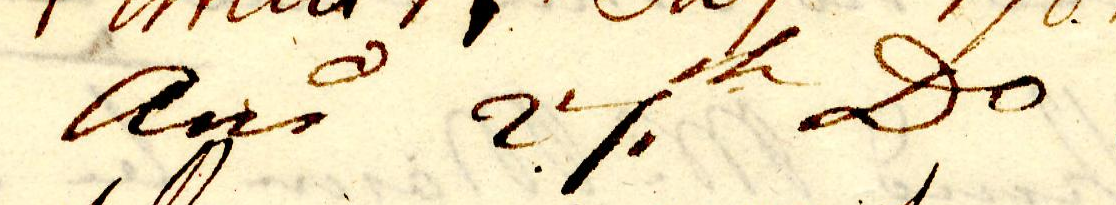Ans^d. 27^th. D^o
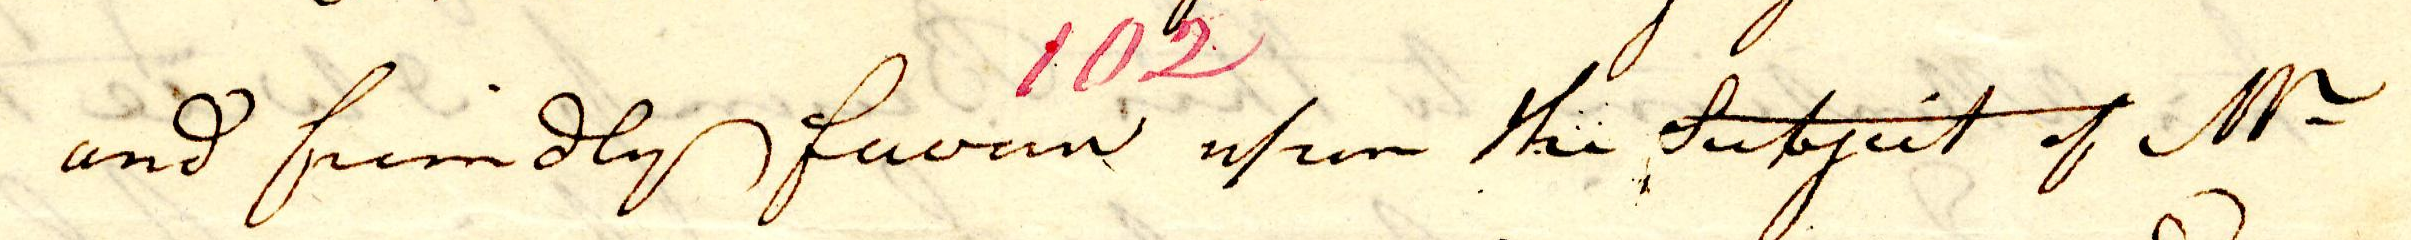and friendly favour upon the Subject of M^r.
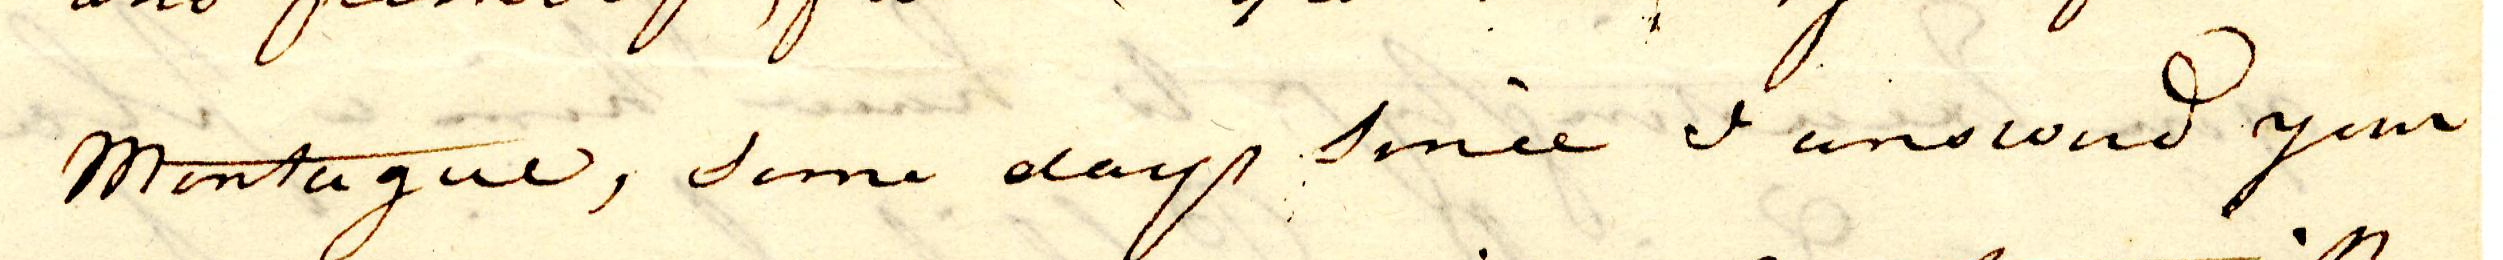Montague, some ays since I answerd your
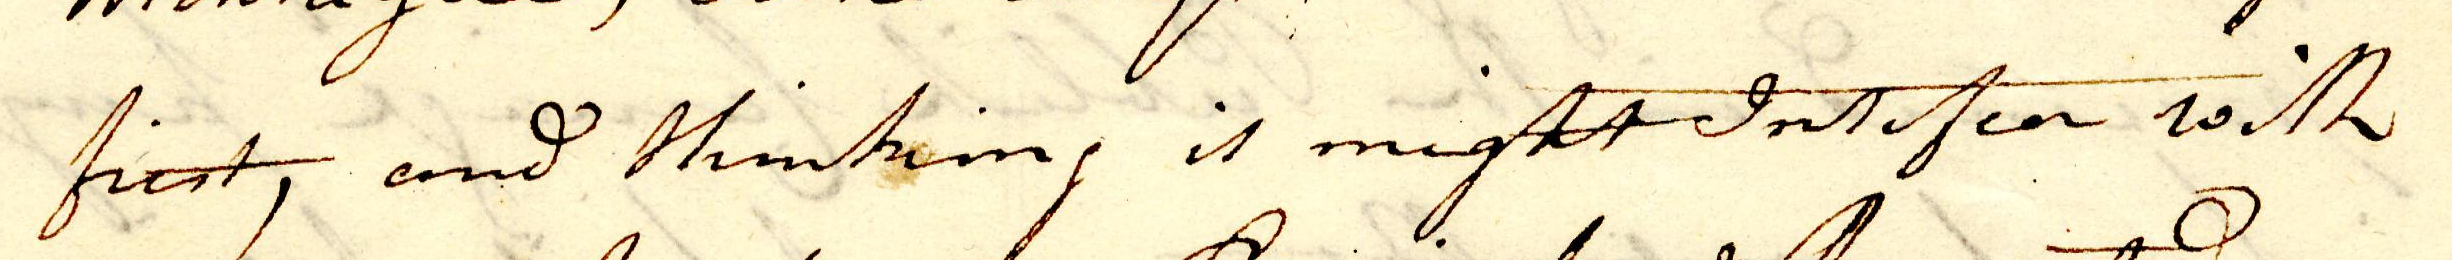first, and thinking it might Interfere with
